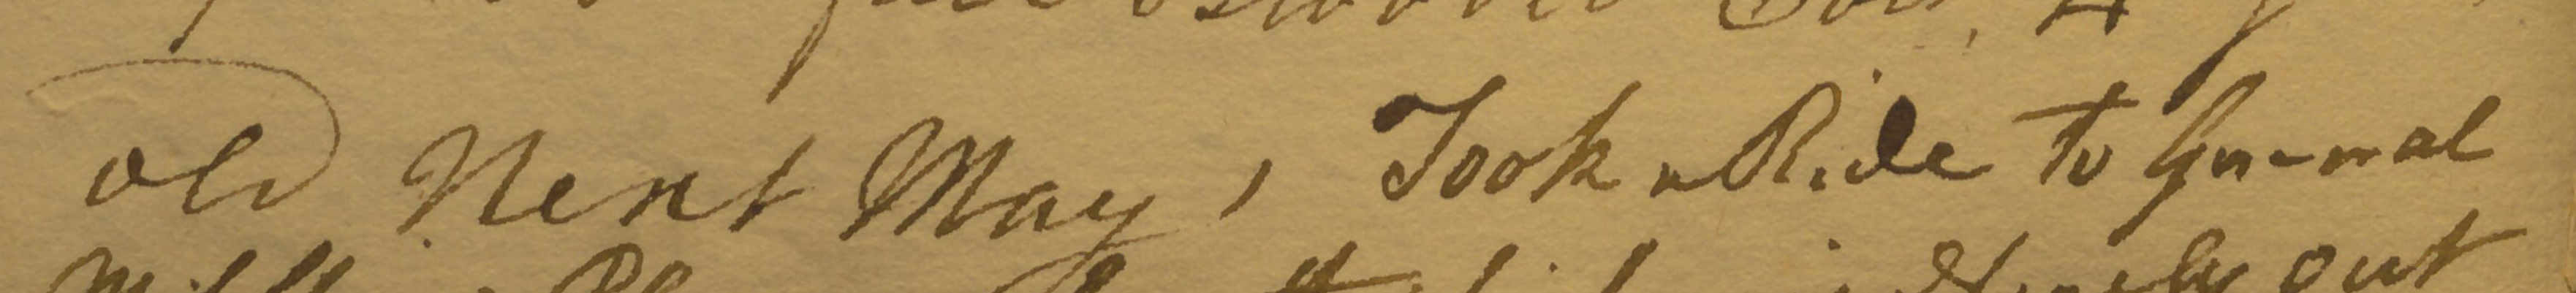old Next May, Took a Ride to General
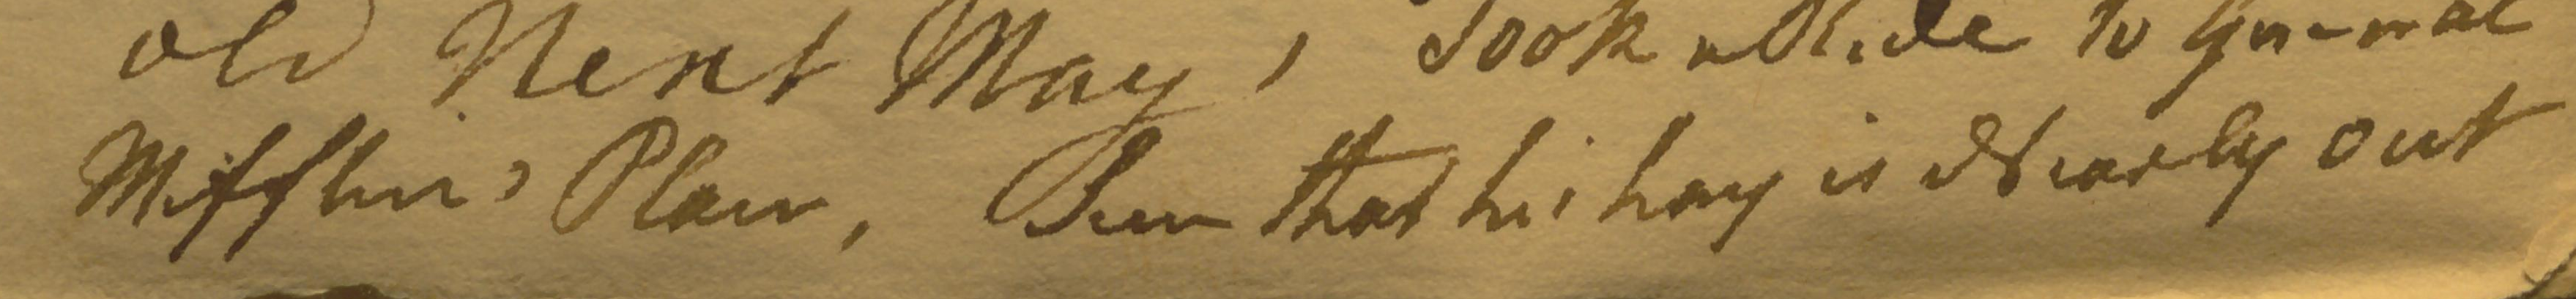Mifflins Plan, seen that his hay is Nearly out
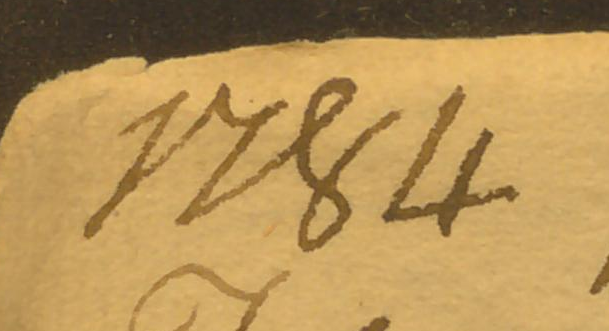1784
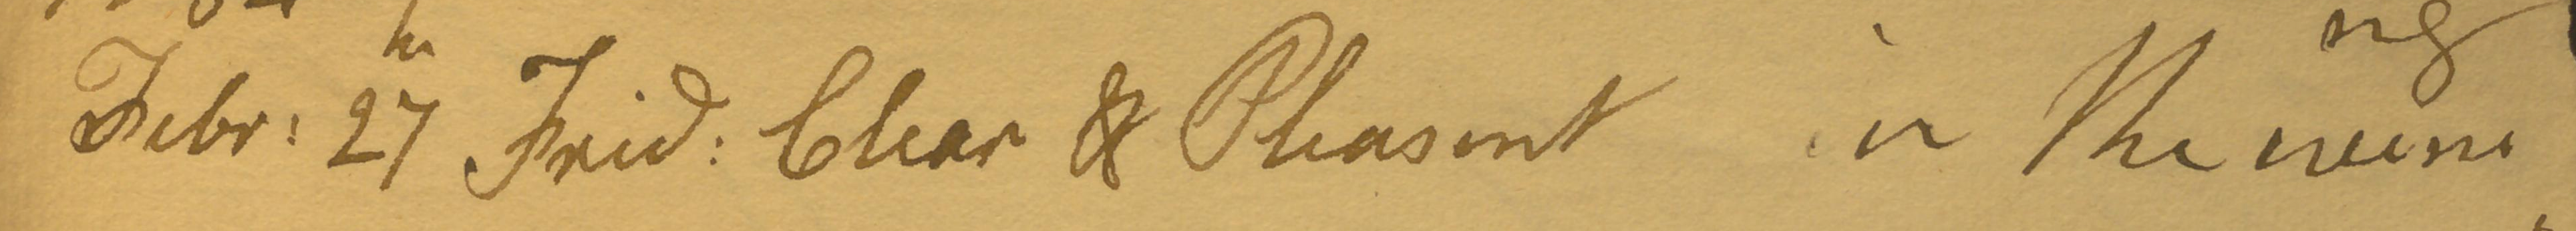Febr. 27^th. Frid. Clear & Pleasent in the eveni^ng
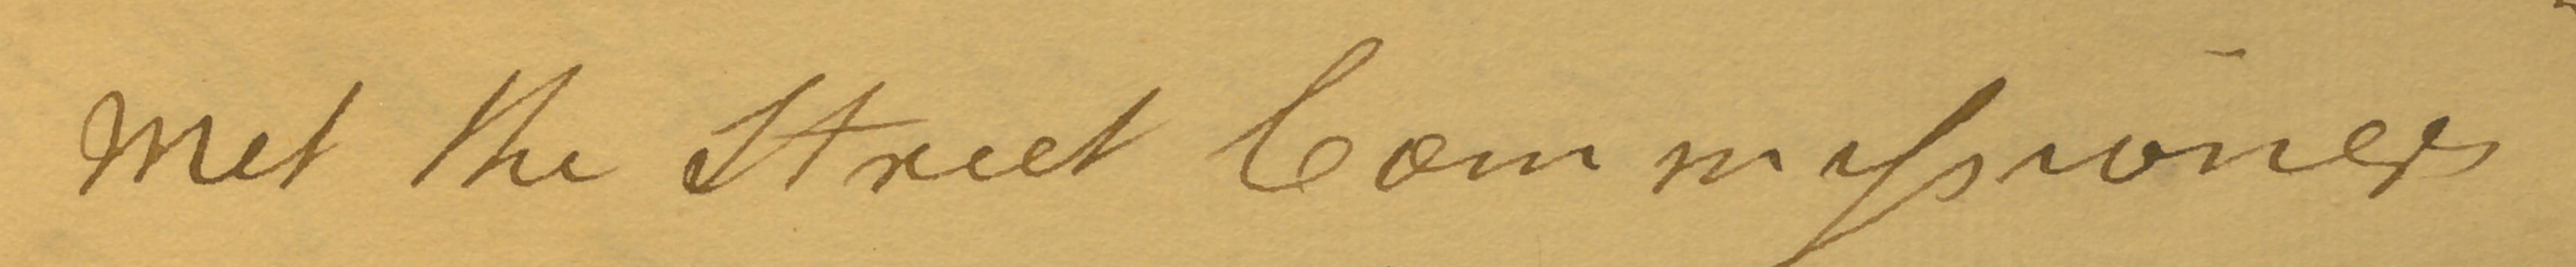met the Street Commissiones
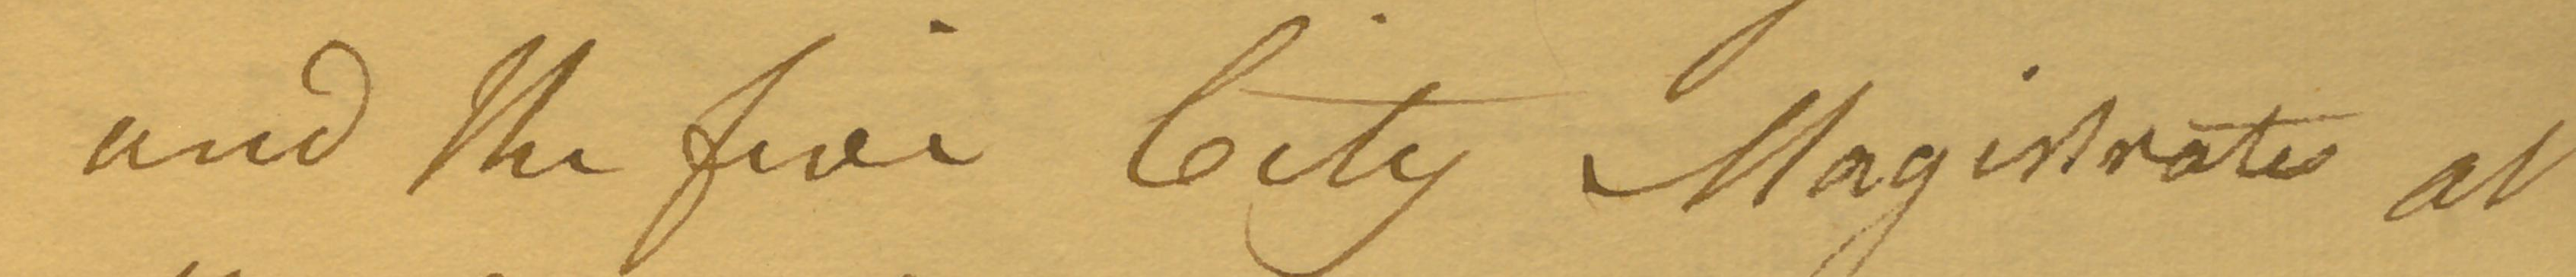and the five City Magistrates at
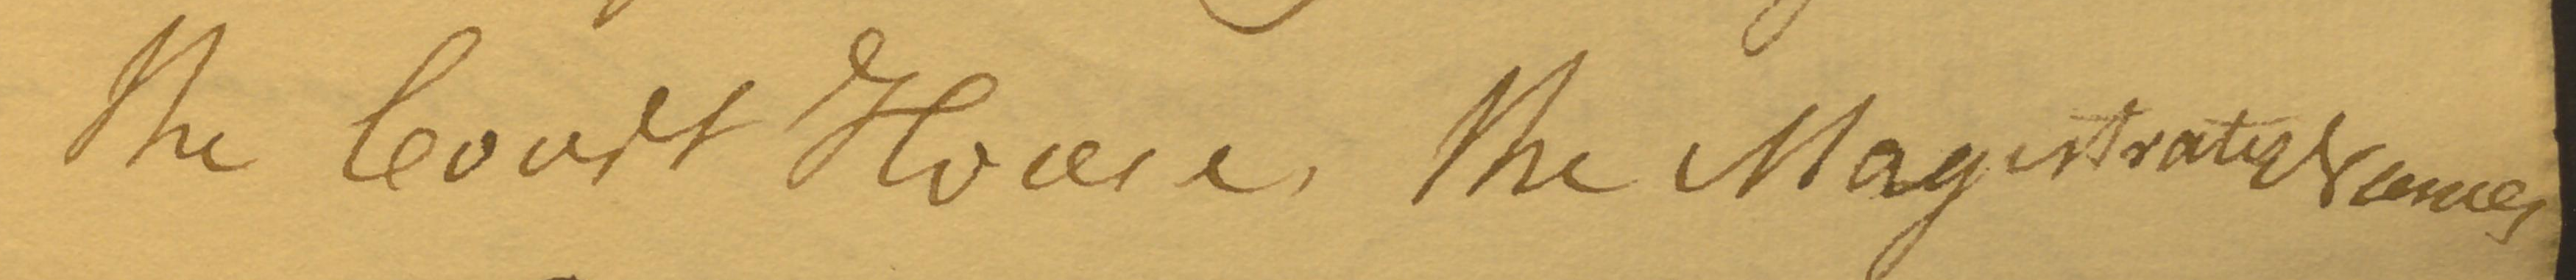the Coort House, the Magistrates Names
